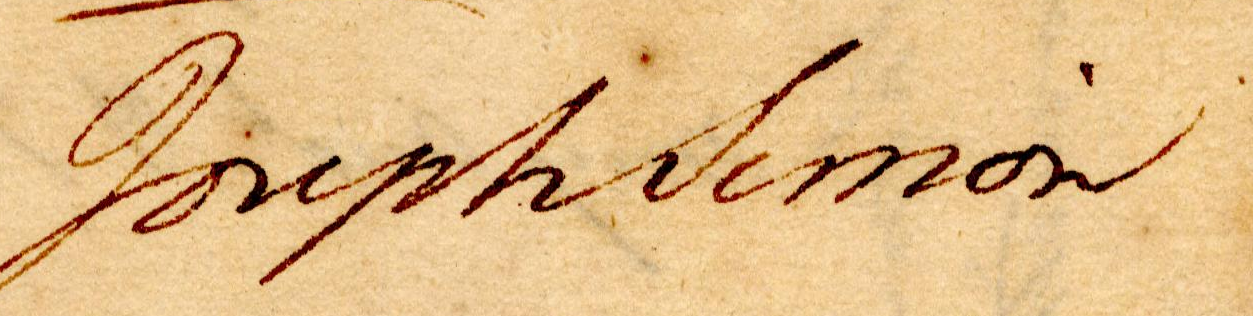Joseph Simon
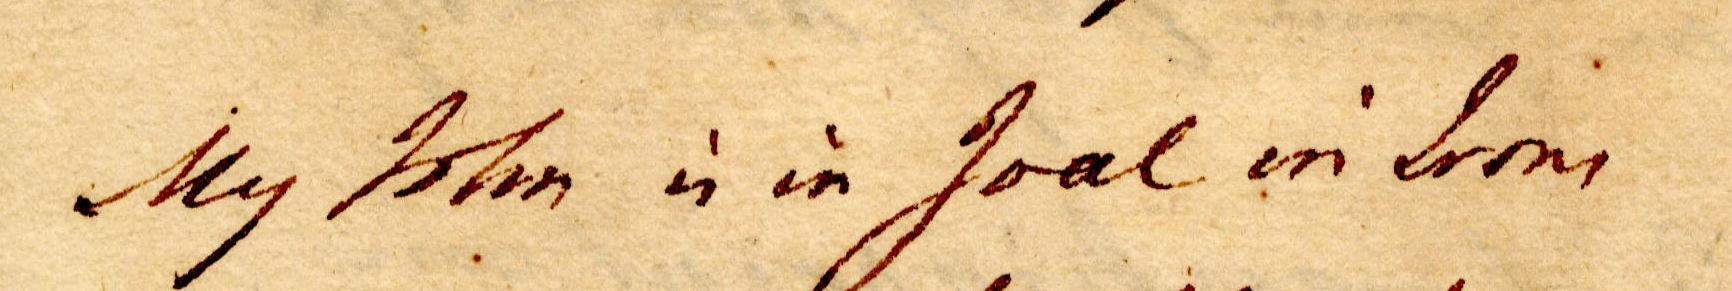My John is in goal in Arms
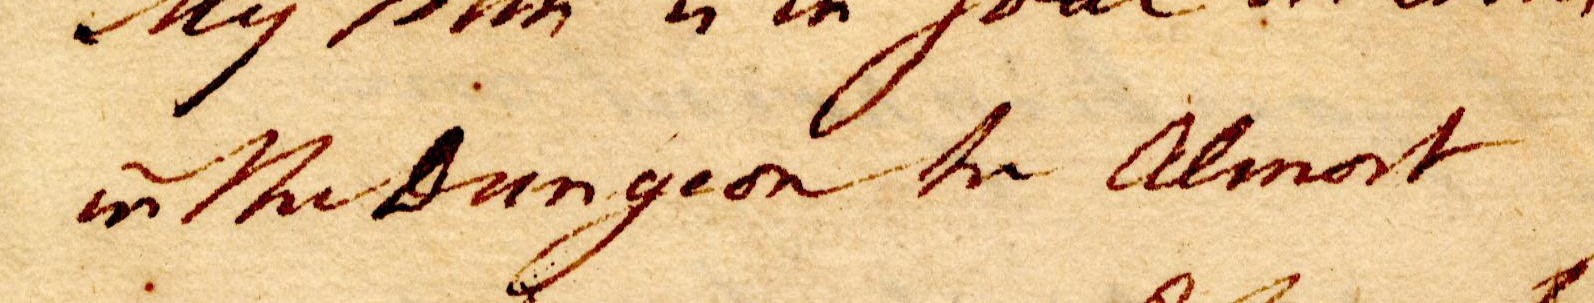in the Dungeon he Almost
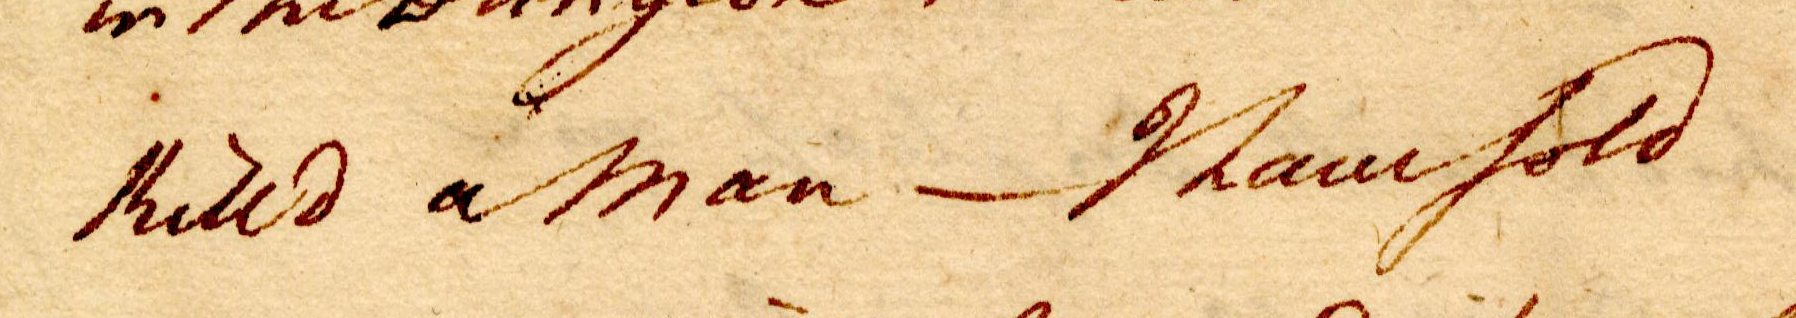killed a man- I have sold
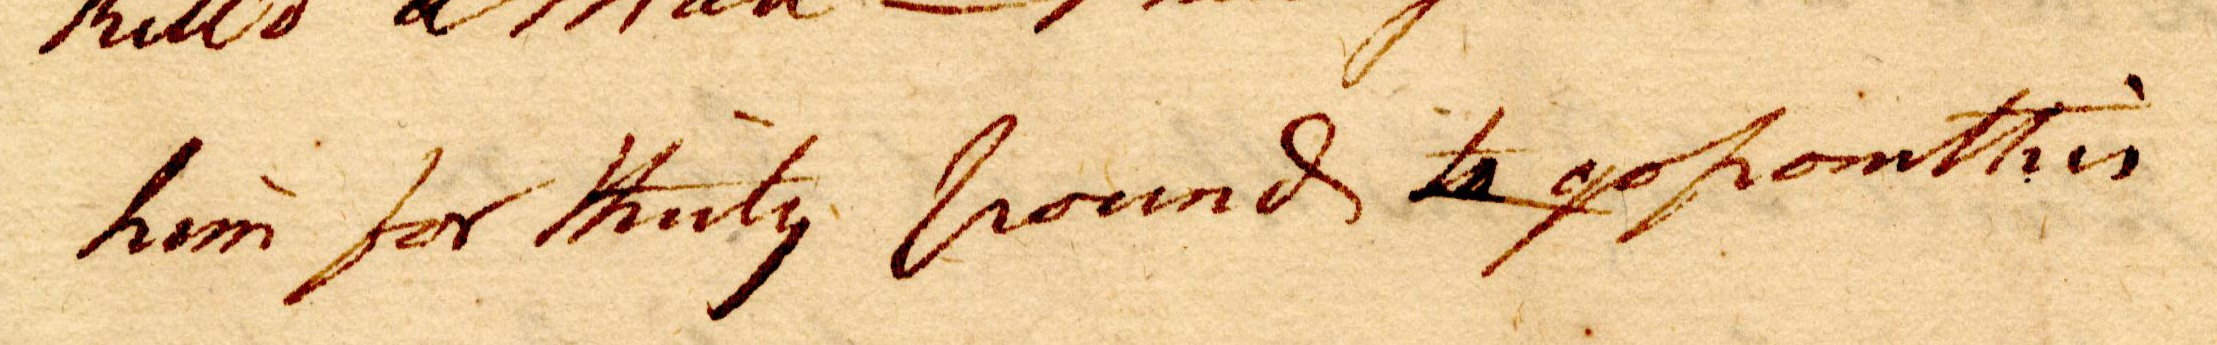him for thirty pounds [to] go from this
